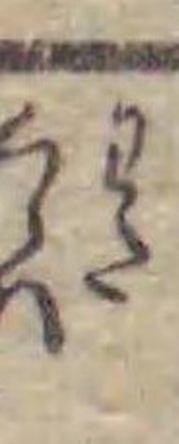くしは
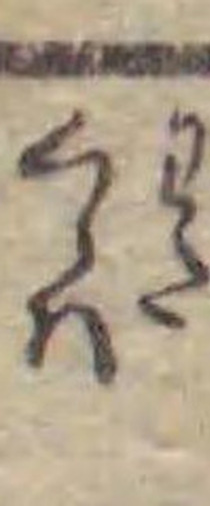くしは
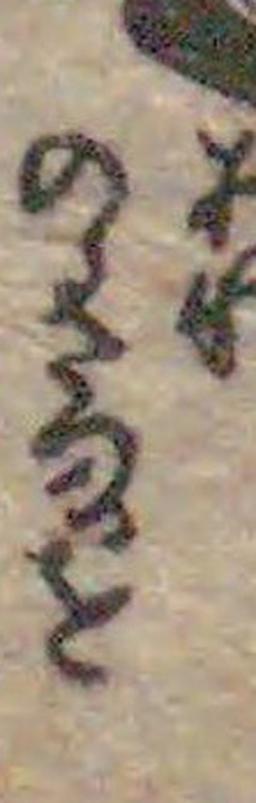のゝさまを
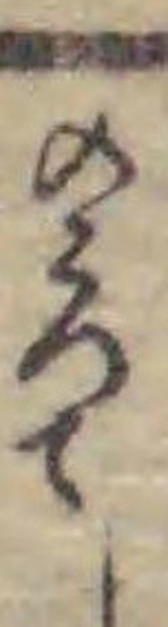のこつて
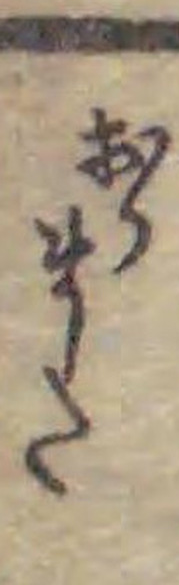ました

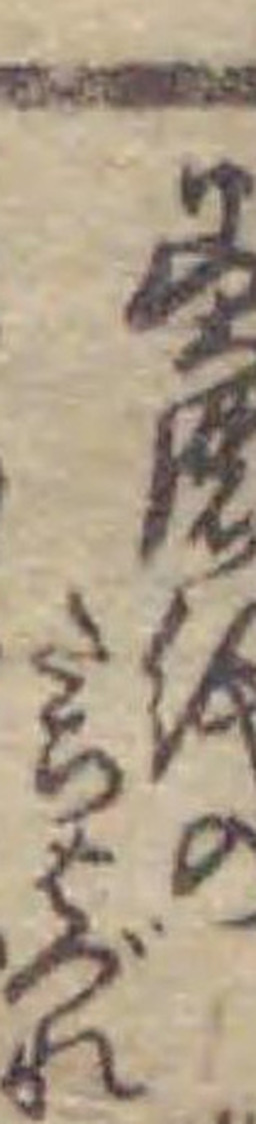たちはづれ
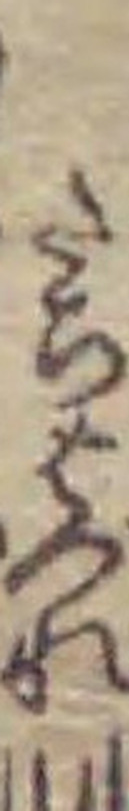たちはづれ
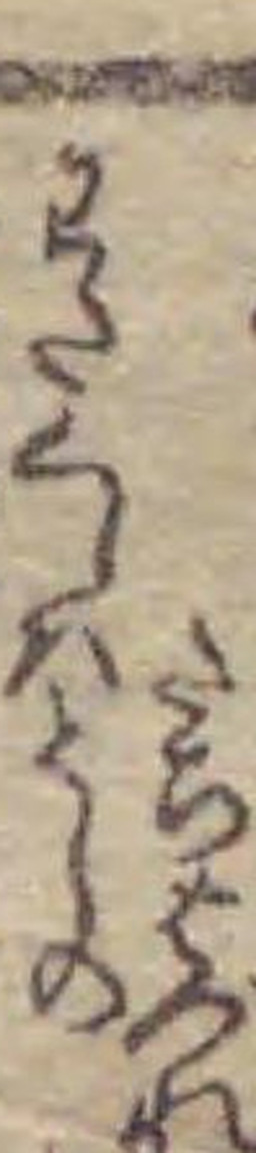わたくしはとしの
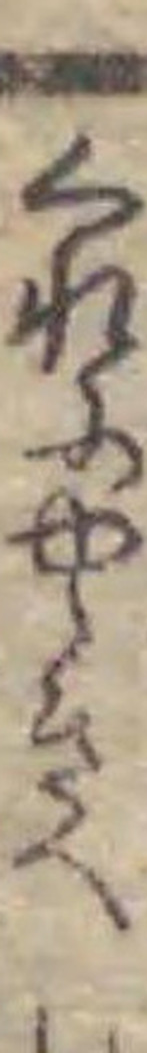くれにやしきへ
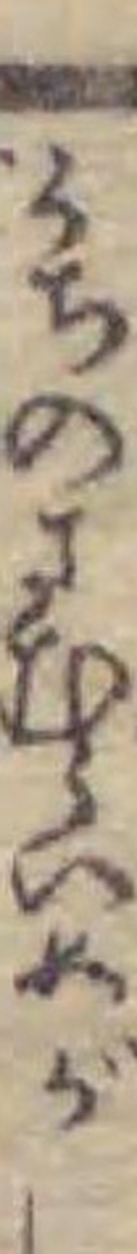うちのさむらいめが
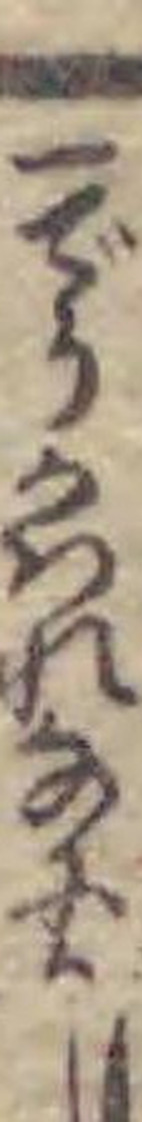一でうかはれなにか
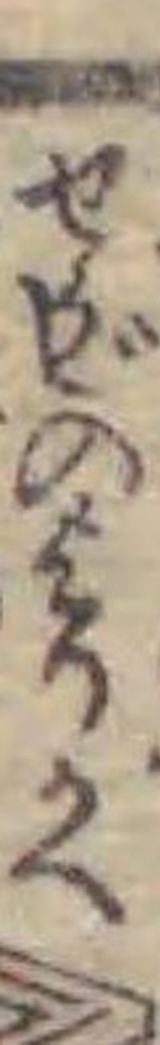せうじのはりかへ
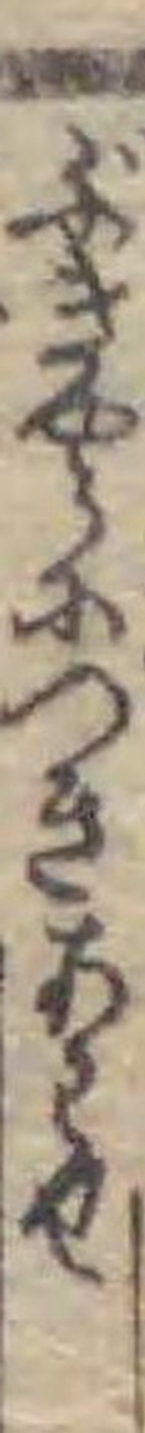ぶきやうにつきあわせ
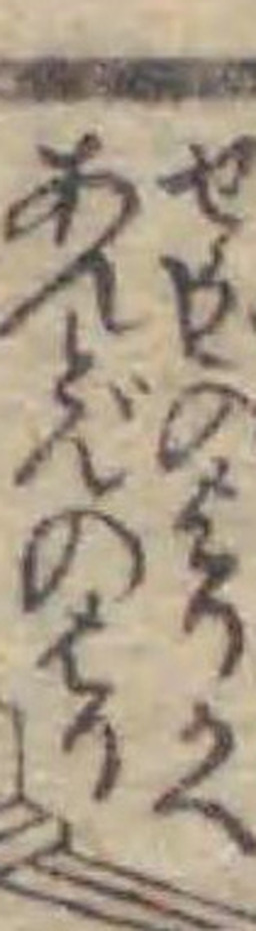あんどんのはり
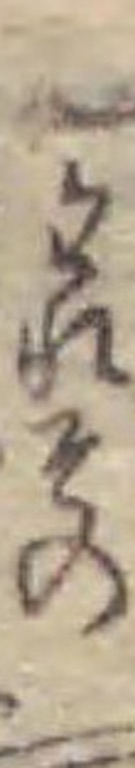われその
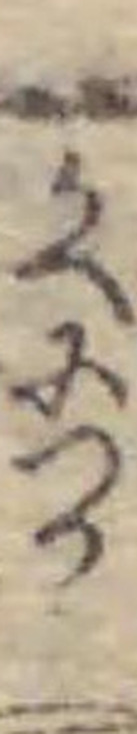かへにつか
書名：紙屑身上噺 : 3巻
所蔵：国立国会図書館 National Diet Library, JAPAN
